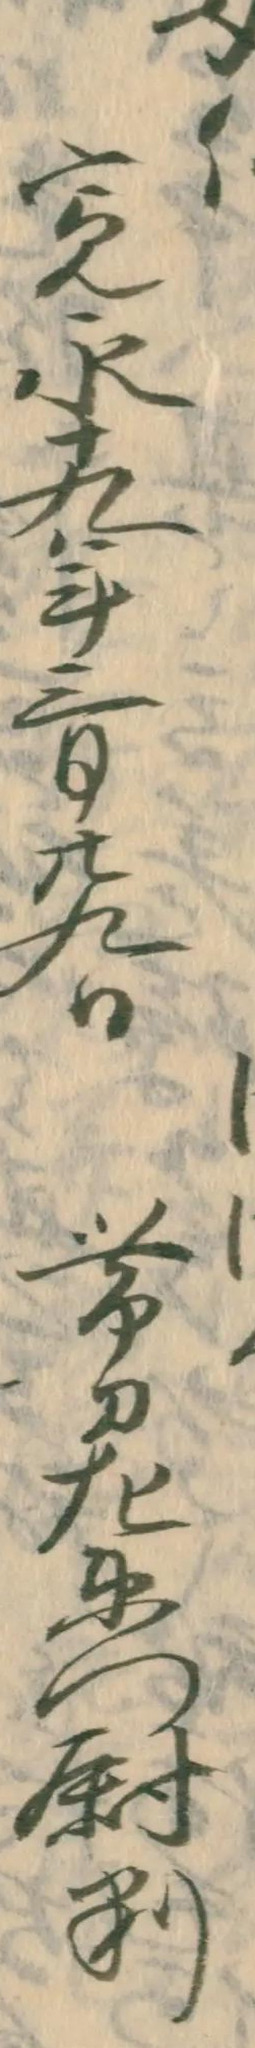△寛永十九年三月廿九日帯刀左衛門尉判
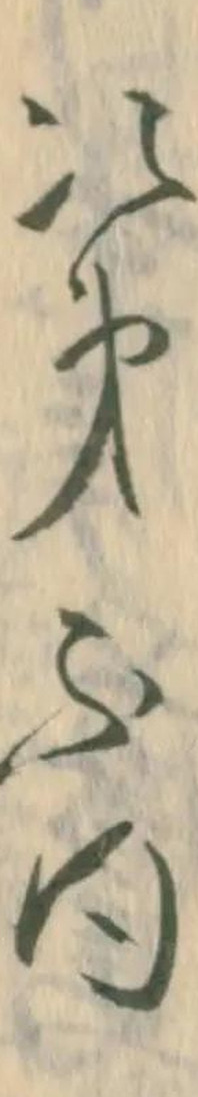次第不同
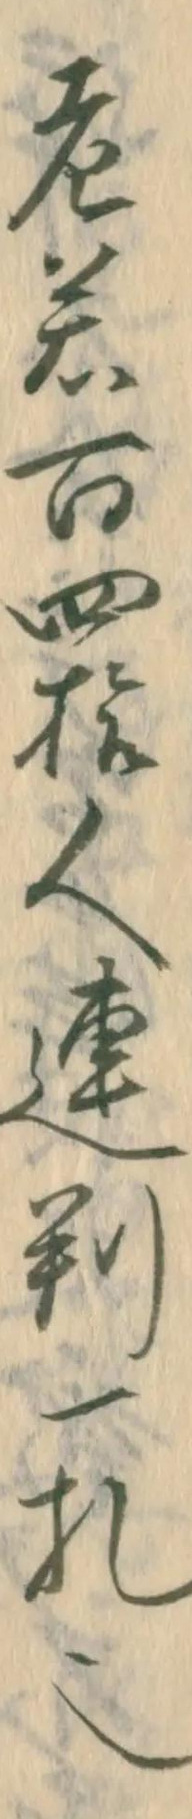老若百四拾人連判一札也
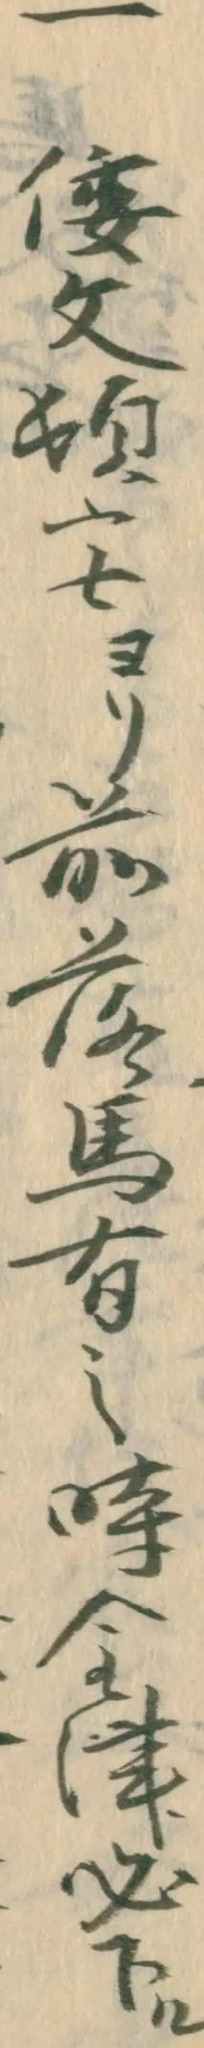一倭文頓宮ヨリ前落馬有之時金津必下ル
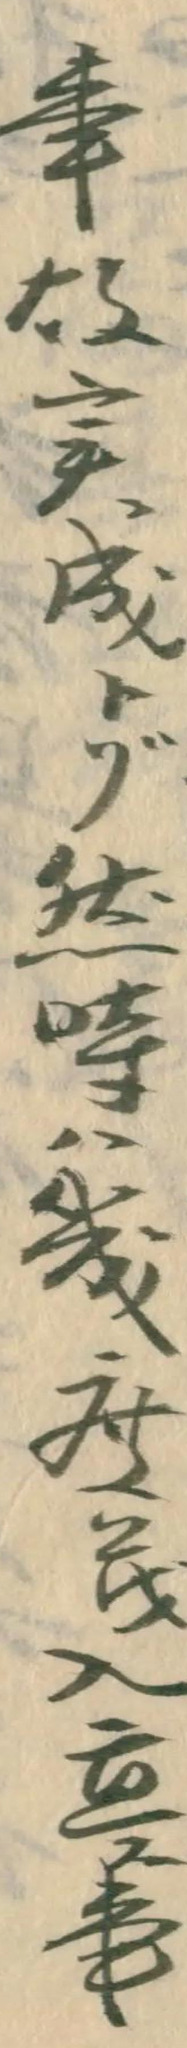事故実成トゾ然時ハ幾度も入直ス事

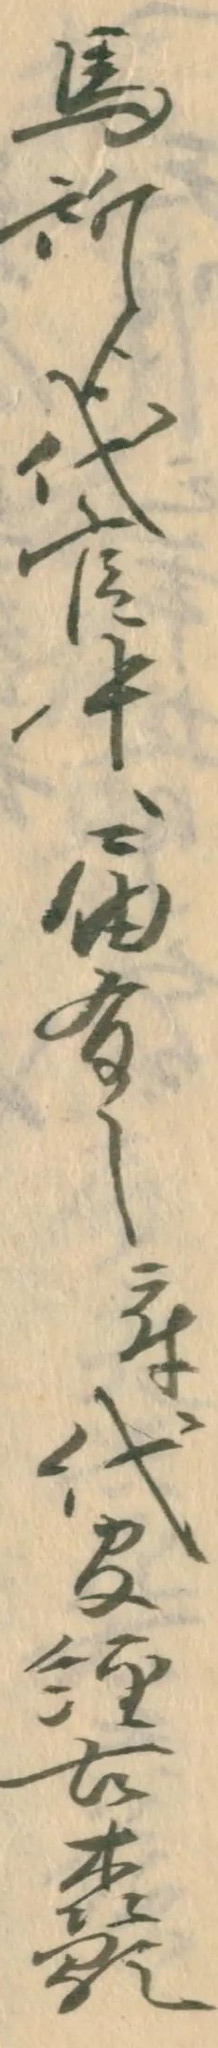馬所ゟ代官中へ届有之ニ付代官経古森顕
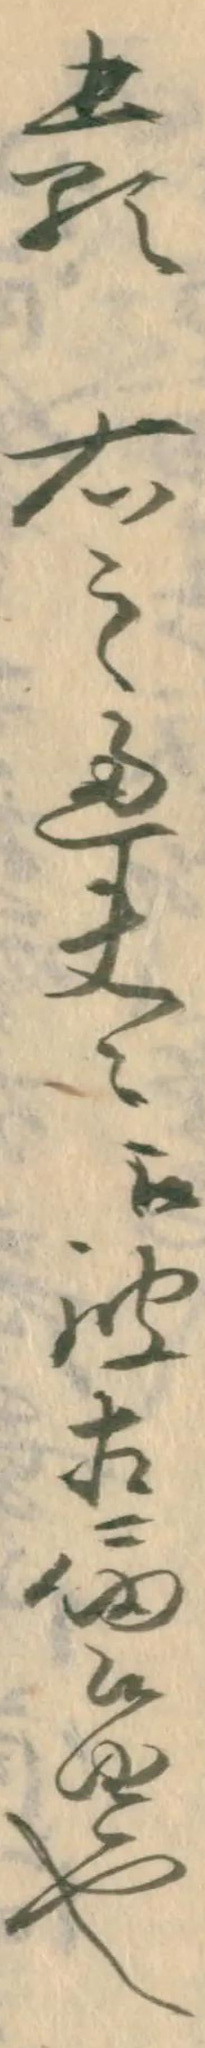出る右之通夫々江被相届候由也
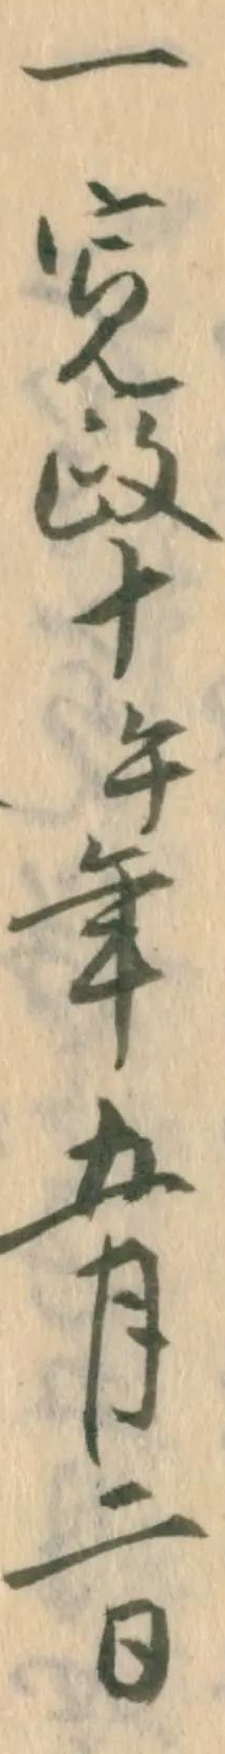一寛政十午年五月二日
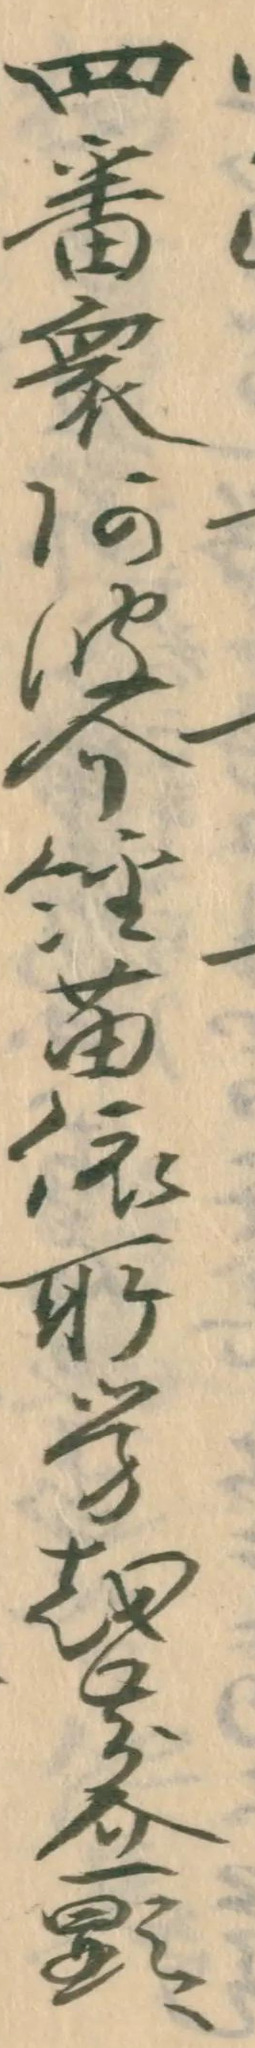四番衆阿波介経苗依所労越前介一顕へ
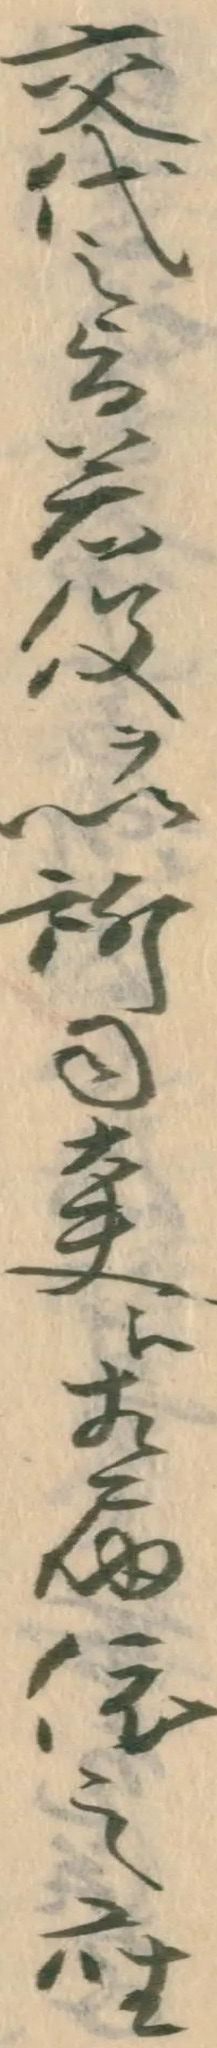交代之旨若役ヲ以所司大夫江相届依之座
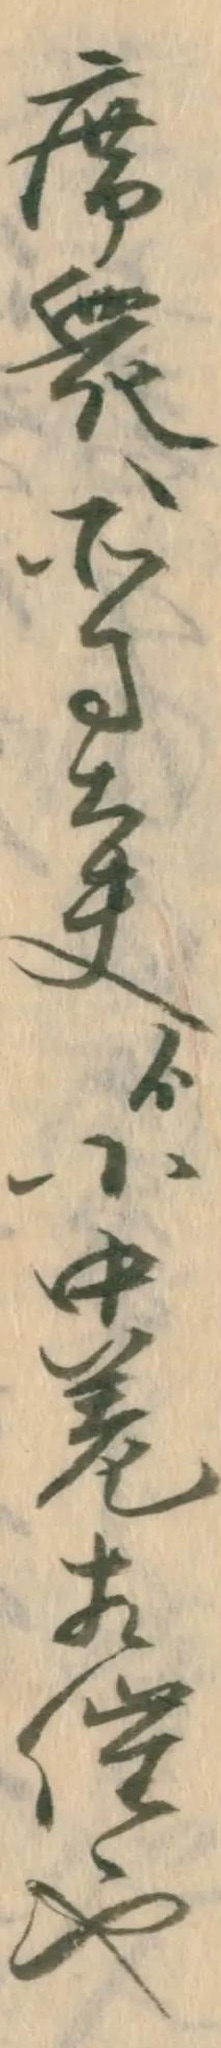席衆へ所司大夫ゟ小中差相催候也
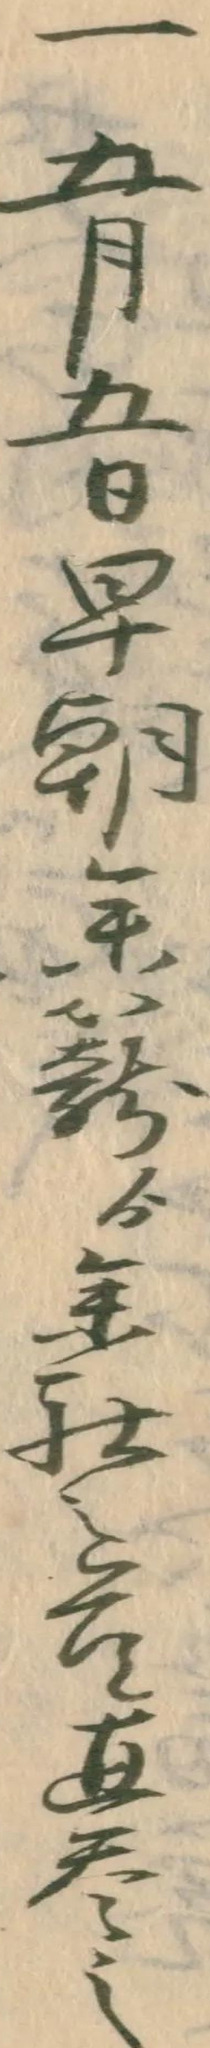一五月五日早朝参籠ゟ参社之節直参之
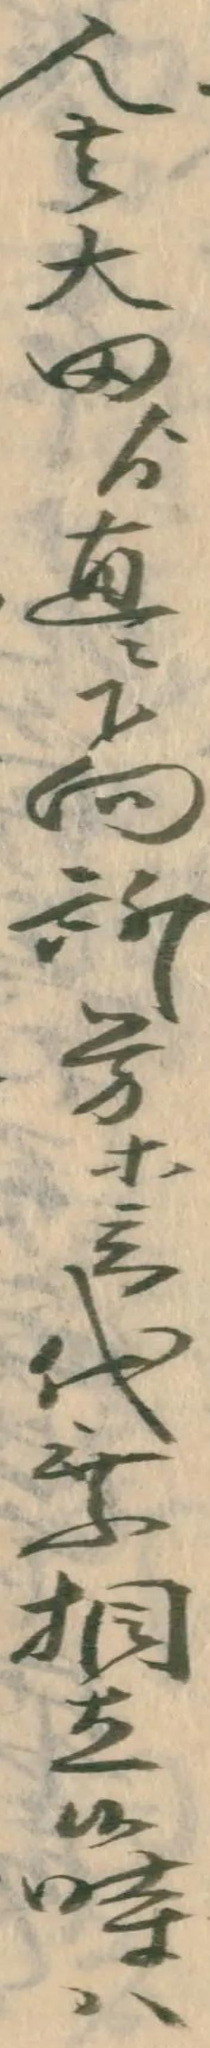人は大田ゟ直ニ下向所労等ニ而代乗相立候時ハ
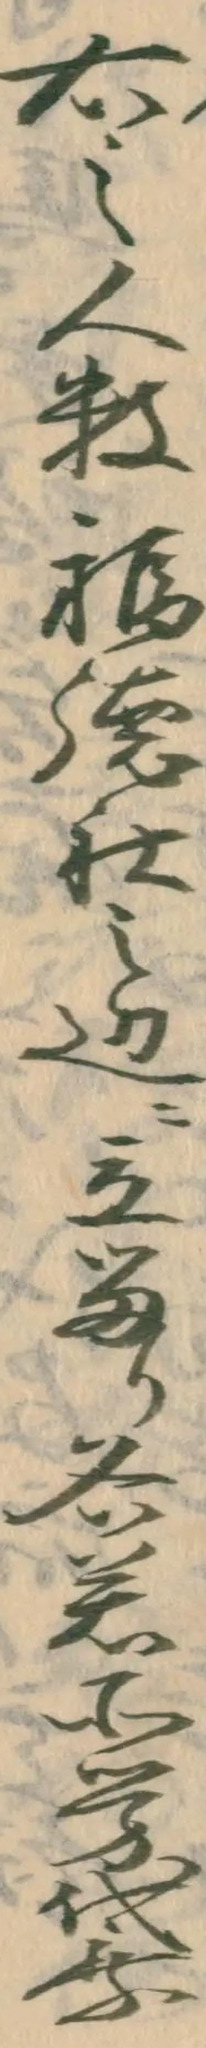右之人数福徳社之辺ニ立留り各若所労代乗
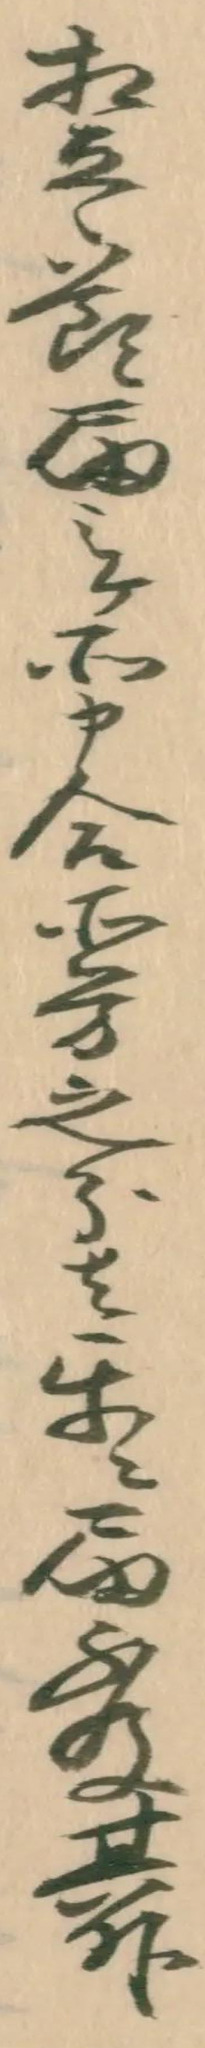相立候節届之ケ所申合所労之分者互ニ届不及其外
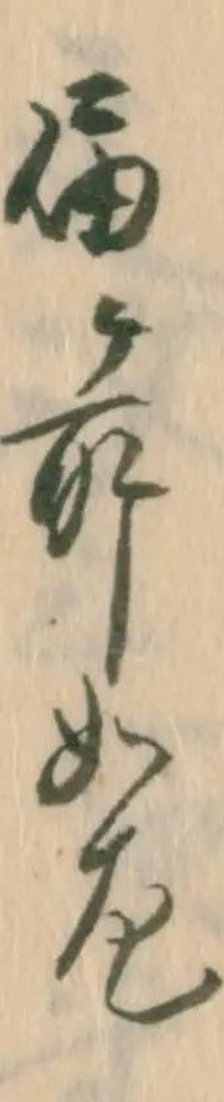届ケ所如左
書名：賀茂社記録. 第12冊
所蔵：国立国会図書館 National Diet Library, JAPAN
